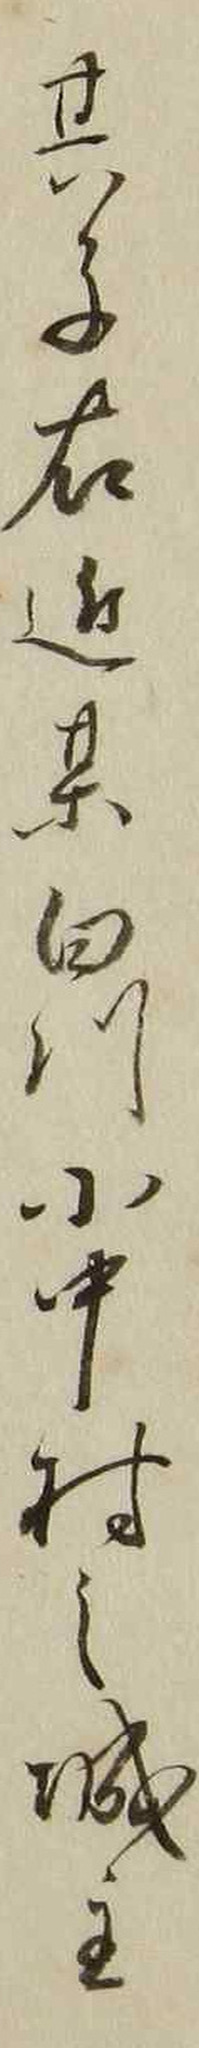其子右近某白川小中村之城主
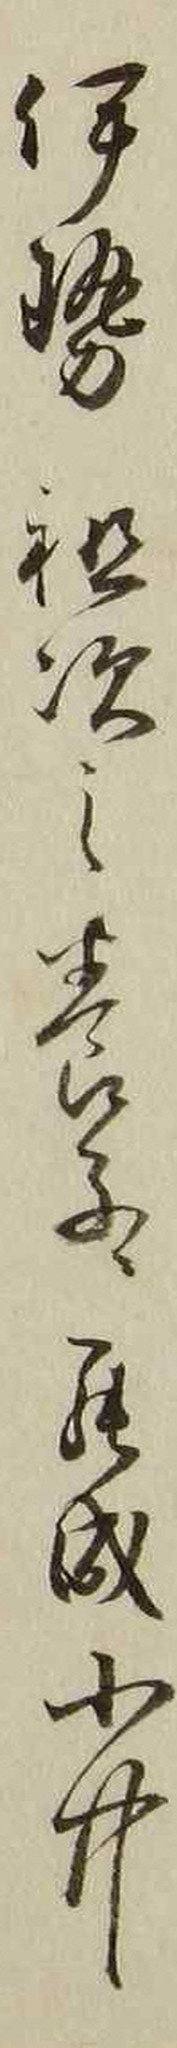伊勢祖次之養子ニ罷成小中
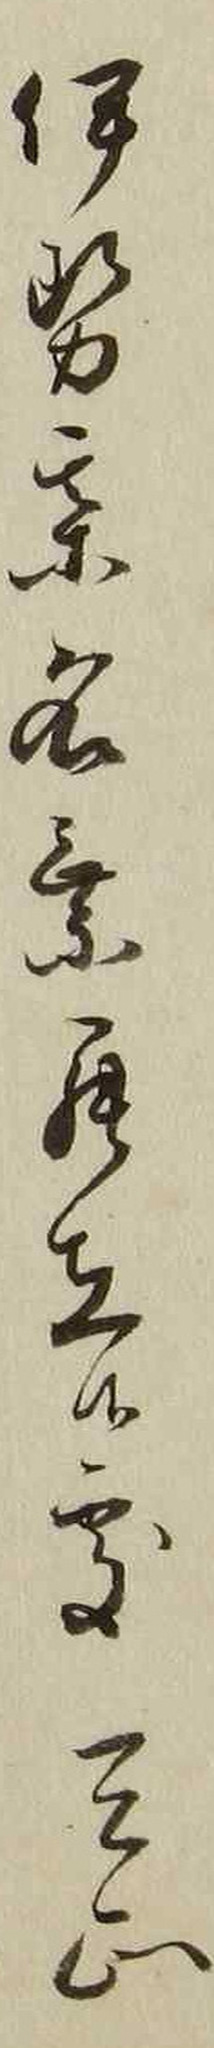伊勢某名乗罷在候処天正
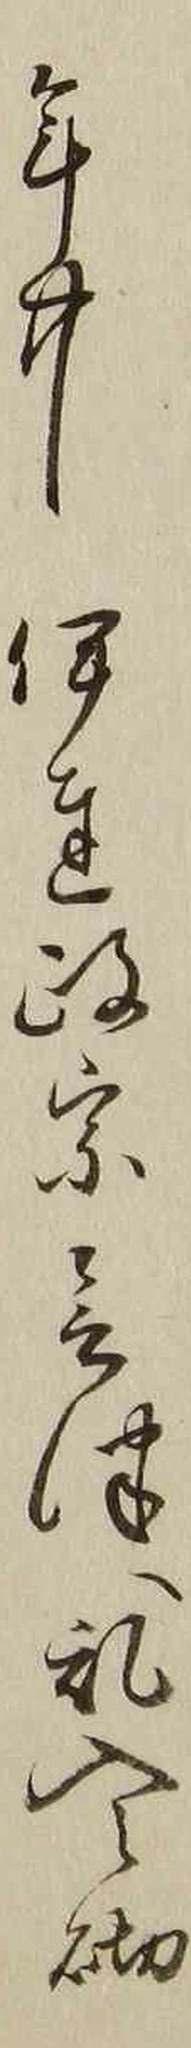年中伊達政宗会津へ乱入之砌
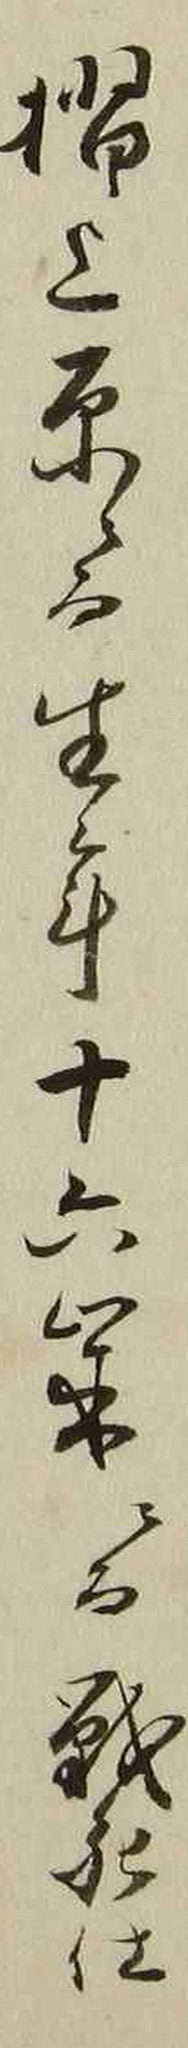摺上原ニ而生年十六歳ニ而戦死仕
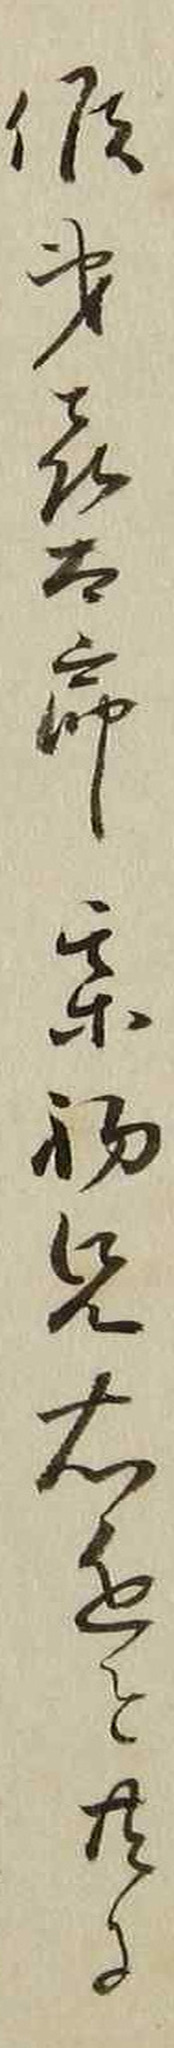候弟喜太郎某初兄右近と共に
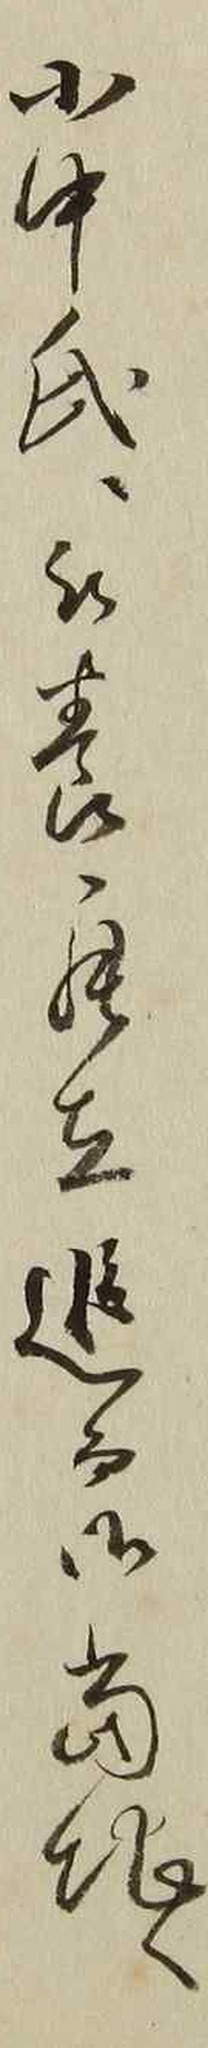小中氏ニ被養罷在追而御当地へ
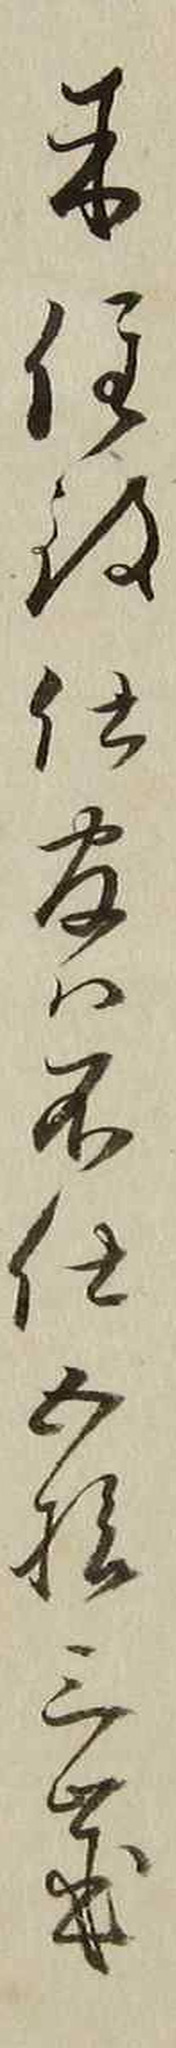来住致仕官ハ不仕五拾三歳
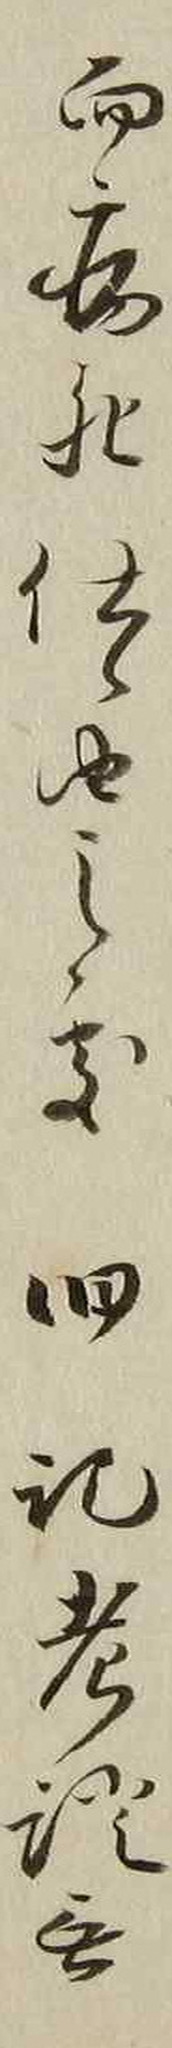而病死仕候由之処旧記考証無
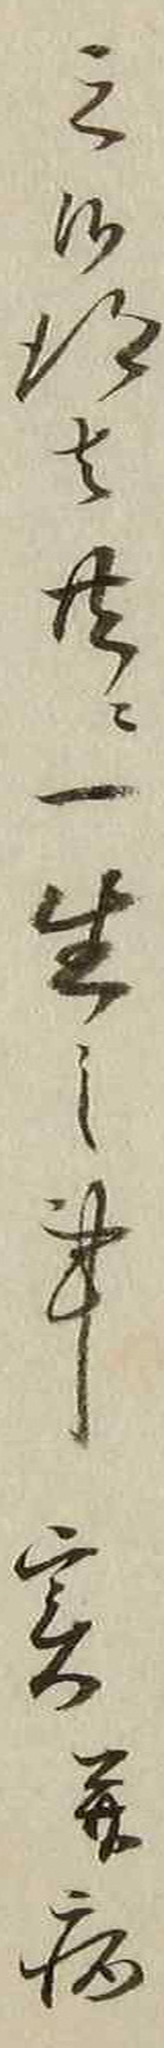之候得は共ニ一生之事実幷病
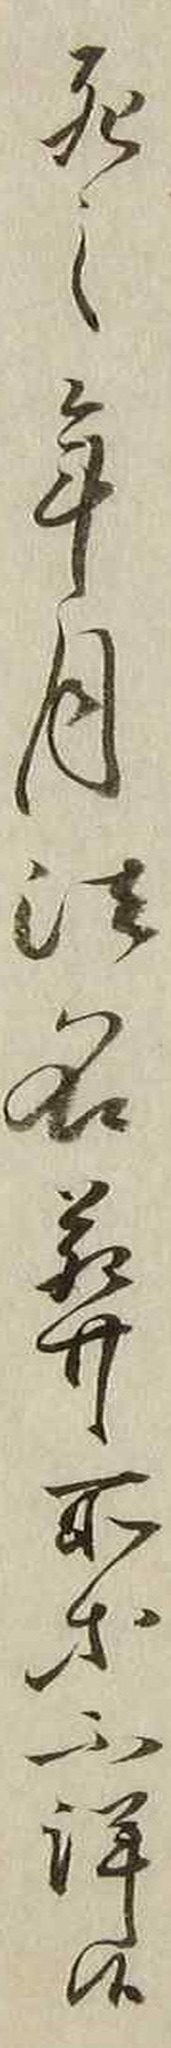死之年月法名葬所等不詳候
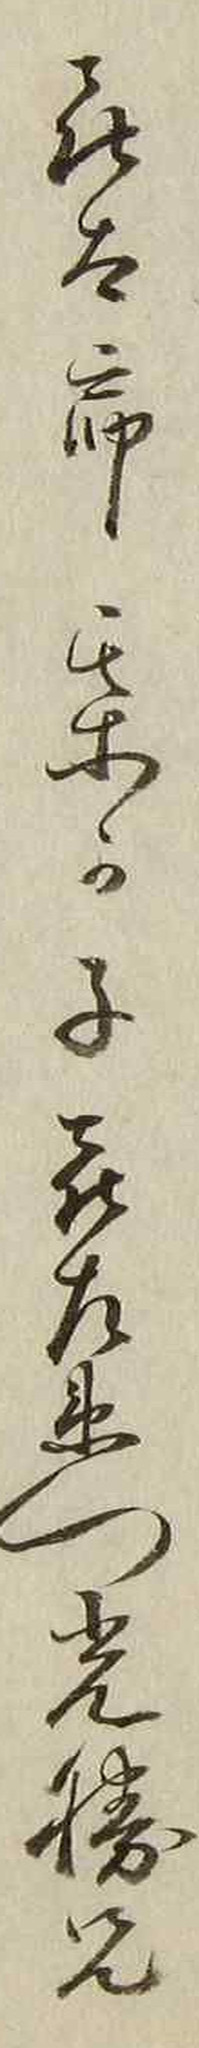喜太郎某か子喜左衛門光勝兄
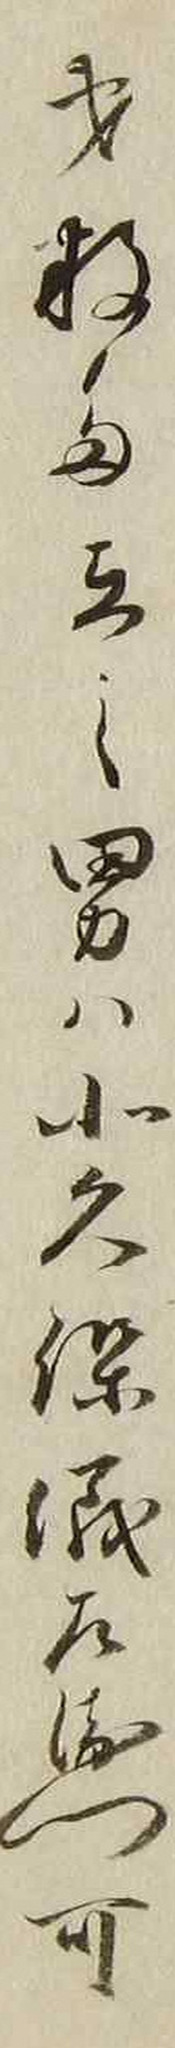弟数多在之男ハ小久保儀左衛門可
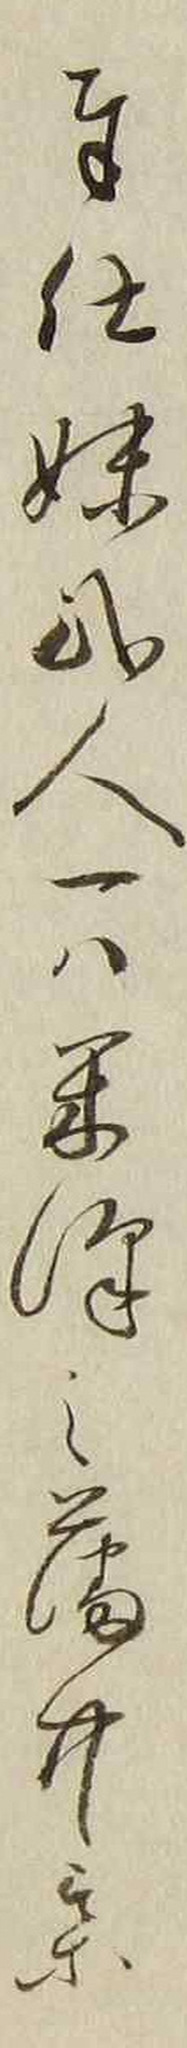奉仕妹弐人一ハ米沢之藩中某
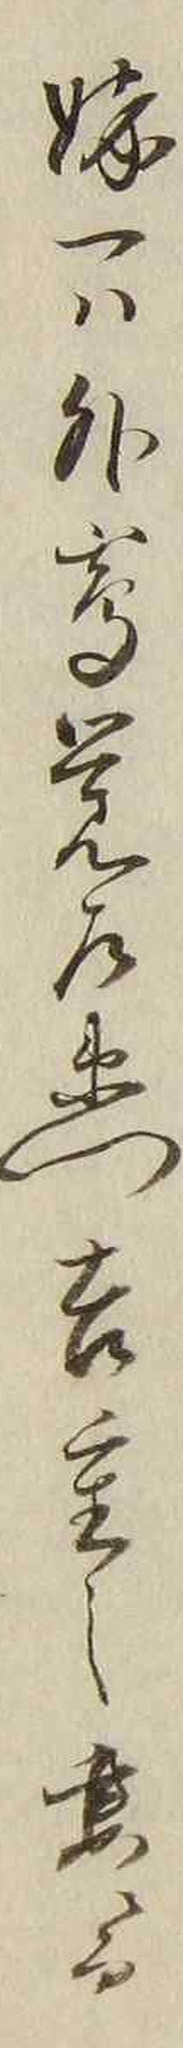嫁一ハ外島覚左衛門吉重之妻ニ而

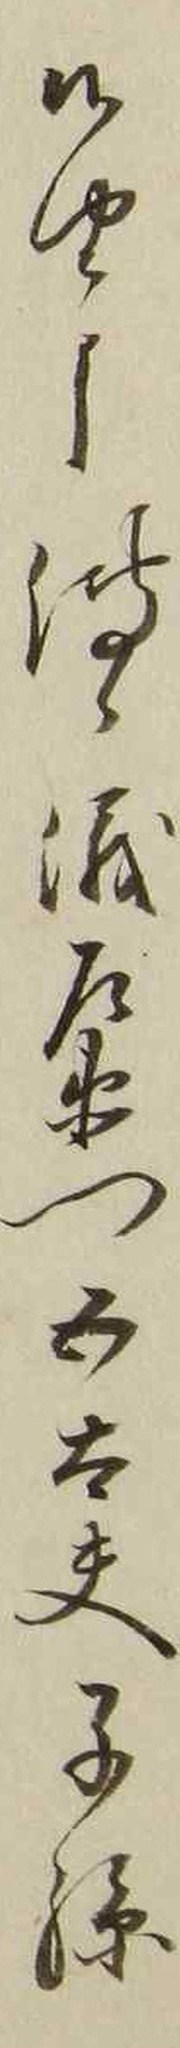候由申伝候儀左衛門五太夫子孫
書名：諸士系譜　巻之52　に之部3
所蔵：会津若松市立会津図書館
